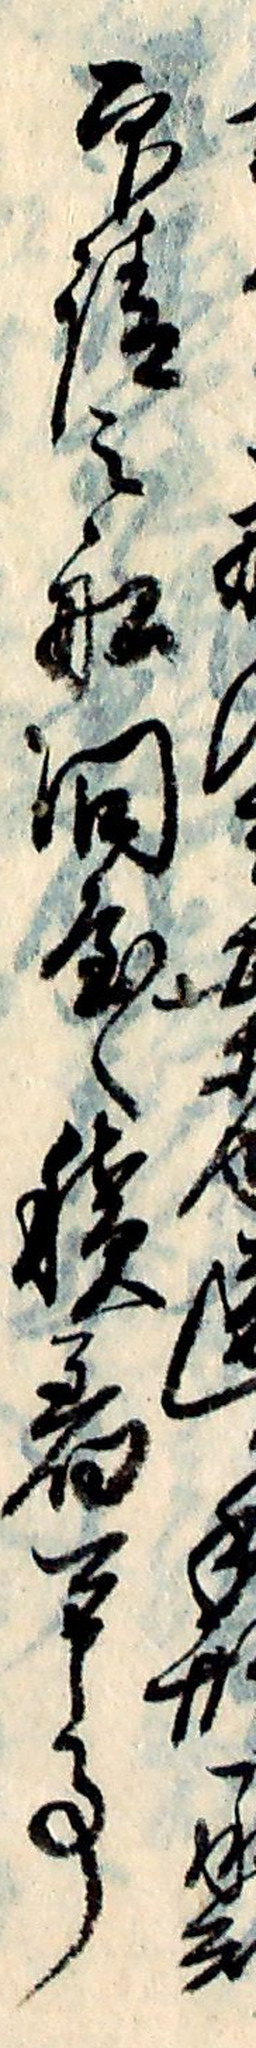印請之船問屋へ積着可申事
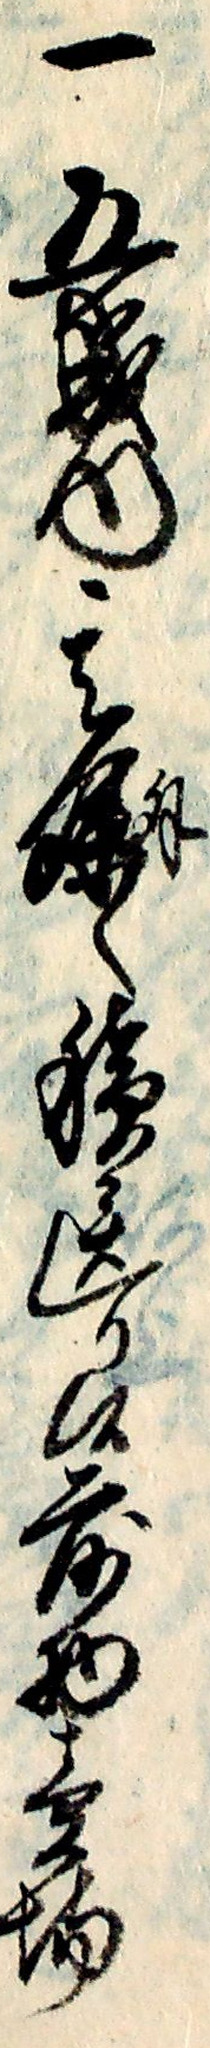一五畿内其外へ積送り候荷物売場
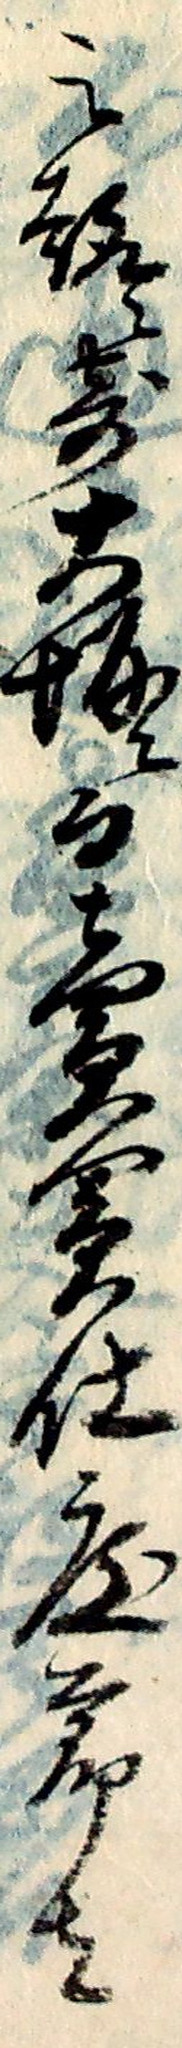之趣に寄大坂にて売買仕度節は
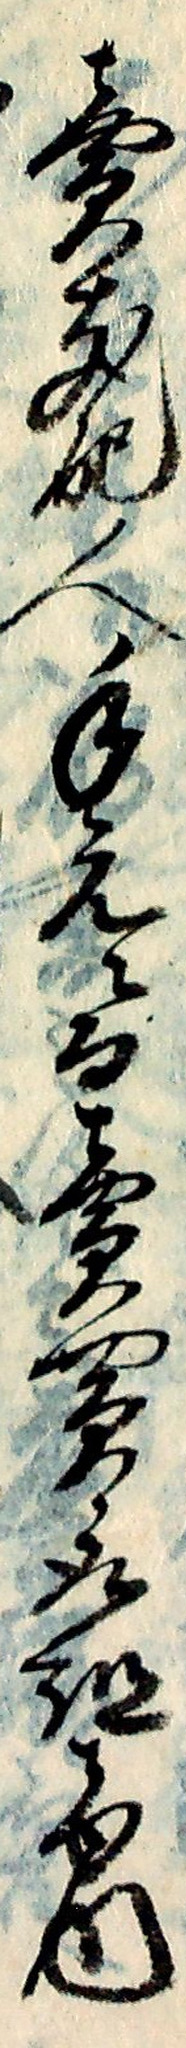売支配人手元にて売買取組商内
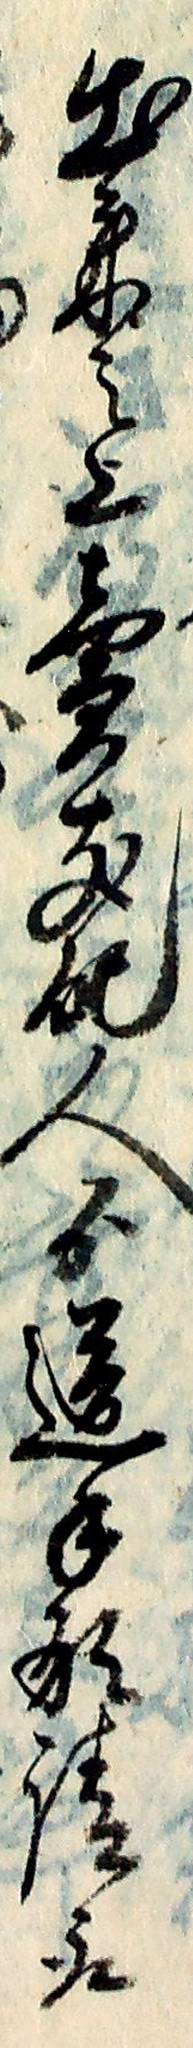出来之上売支配人ゟ送手形請取
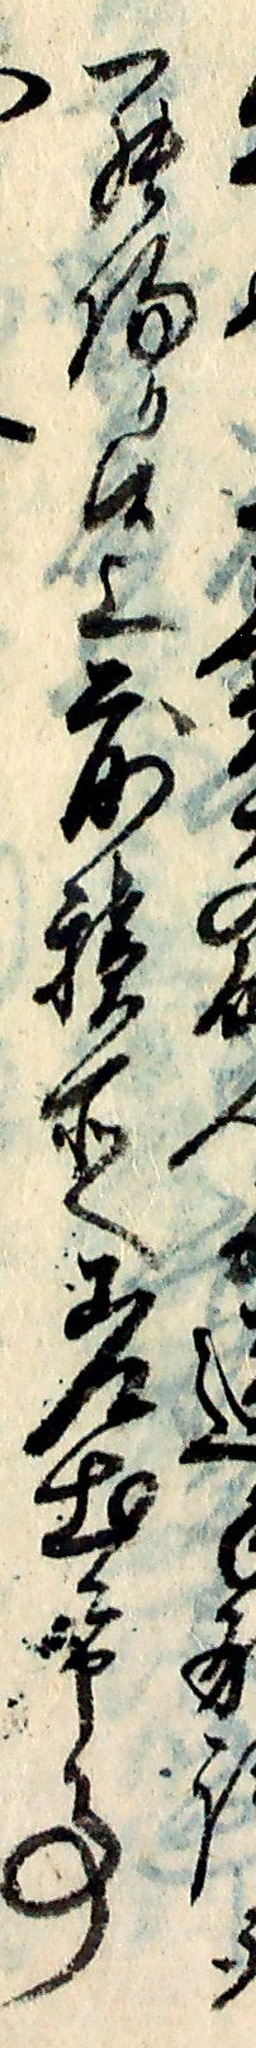罷帰り候上荷積所へ差出可申事
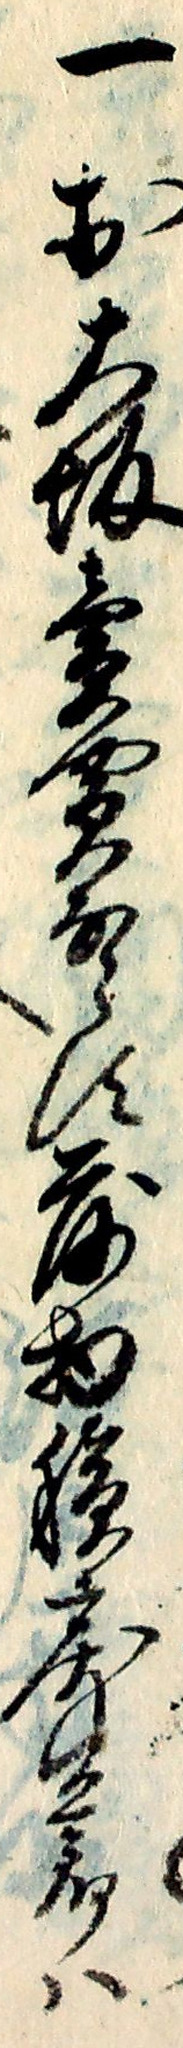一於大坂売買ならす荷物積戻候節は
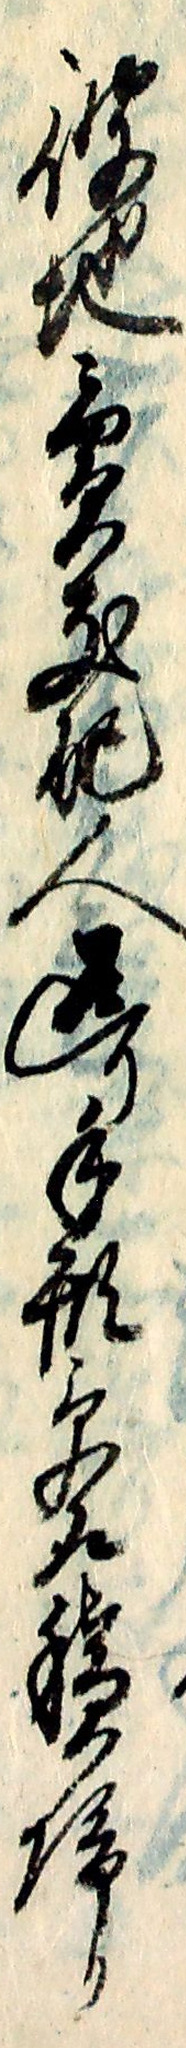彼地売支配人送り手形受取積帰り
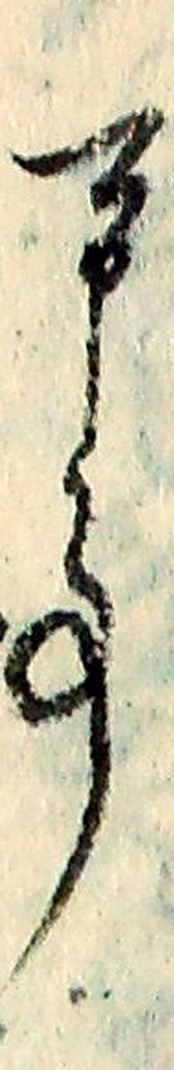可申事
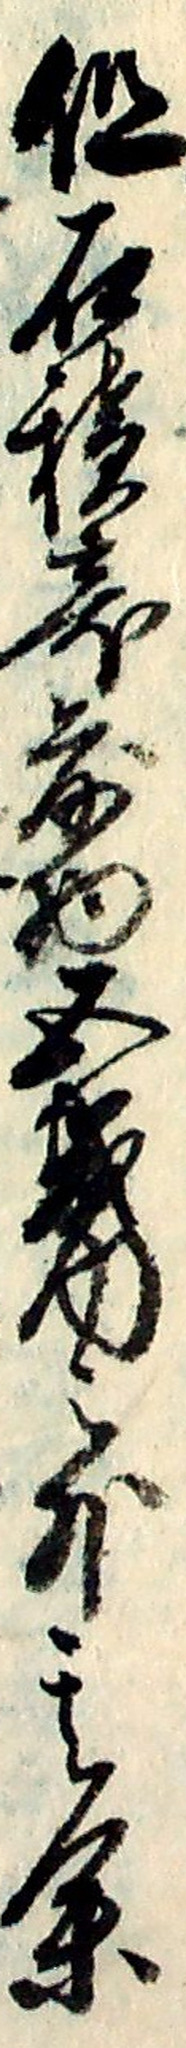但右積戻荷物五畿内之外其余
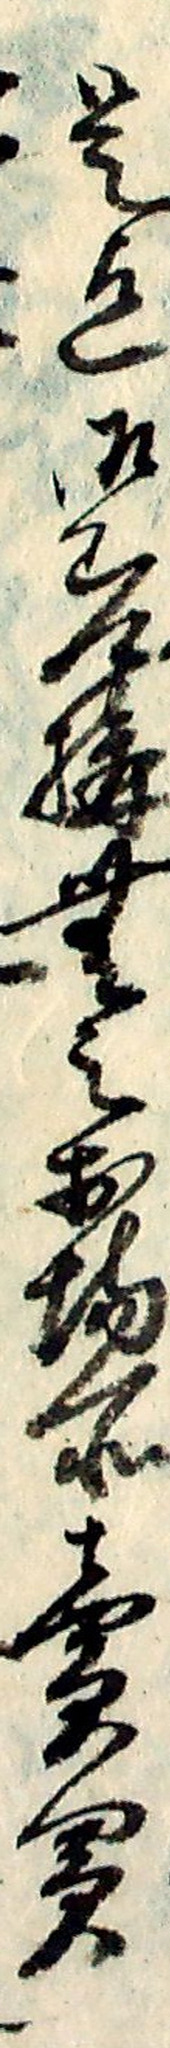是迄御差構無之於場所売買
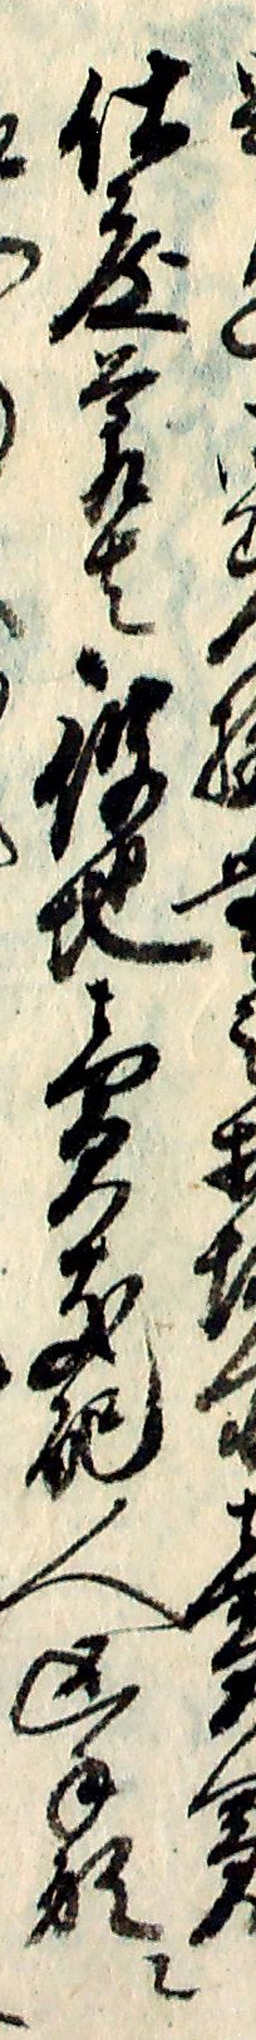仕度節は彼地売支配人送手形に
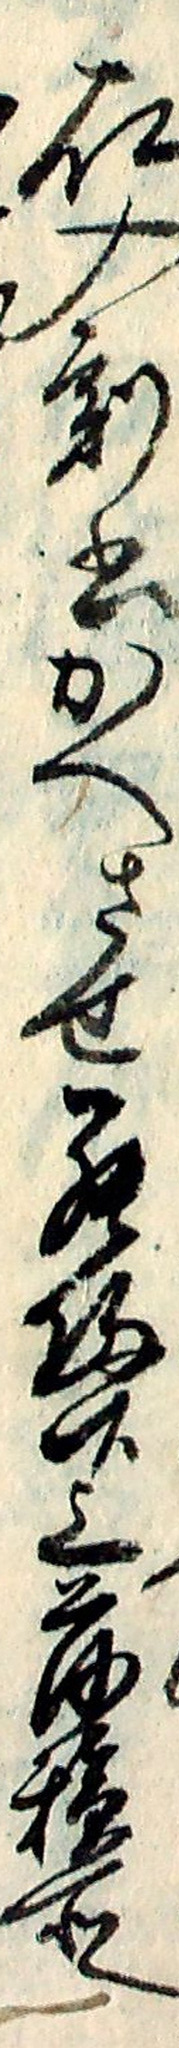右入割書加へさせ罷帰候上荷積所へ
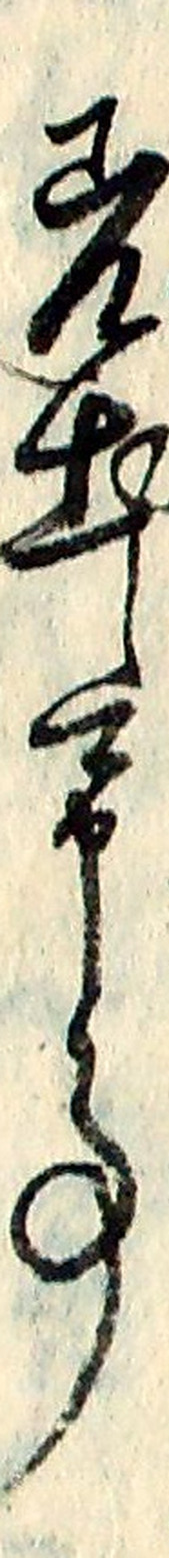差出し可申事
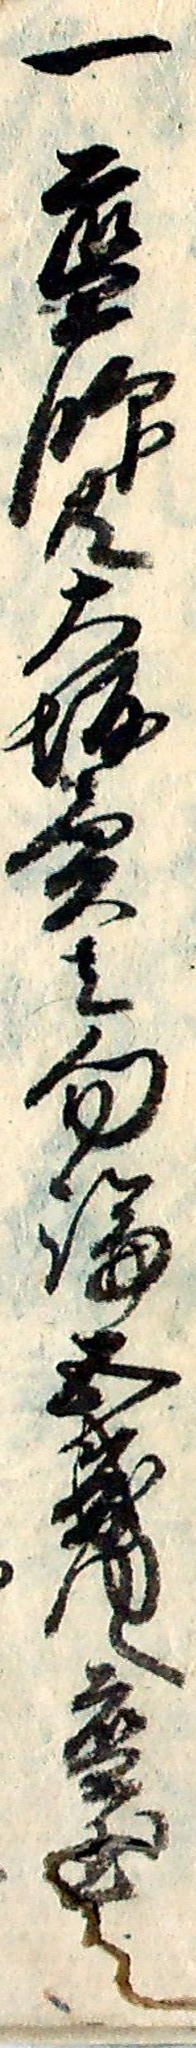一藍師共大坂売は勿論五畿内へ藍玉
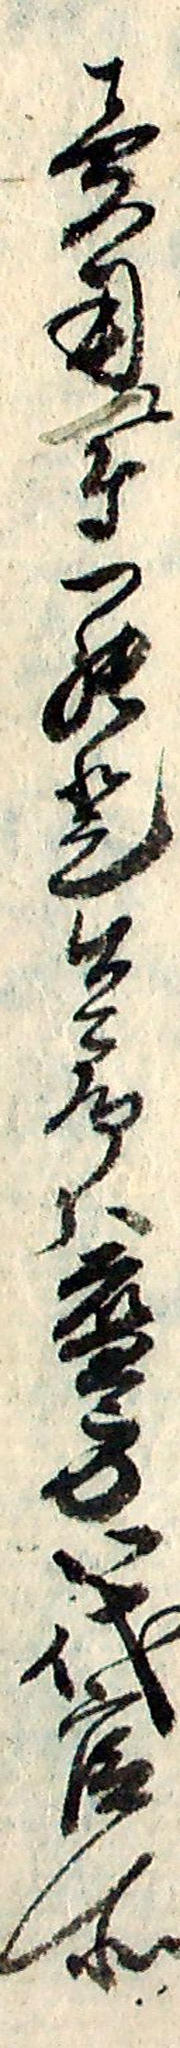売用に付罷登候節は藍方御代官所
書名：諸御願書控(後藤氏壱番）
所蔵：鳴門教育大学 Naruto University of Education
